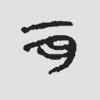一月
